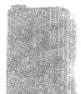卒
